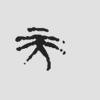天
